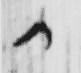人
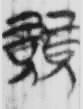競
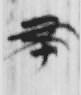不
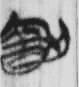割
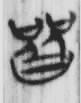朁
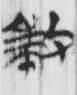殺
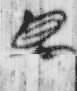睪
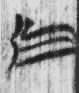於
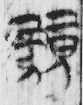競
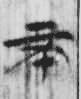不
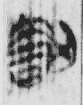割
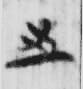之
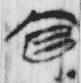官
